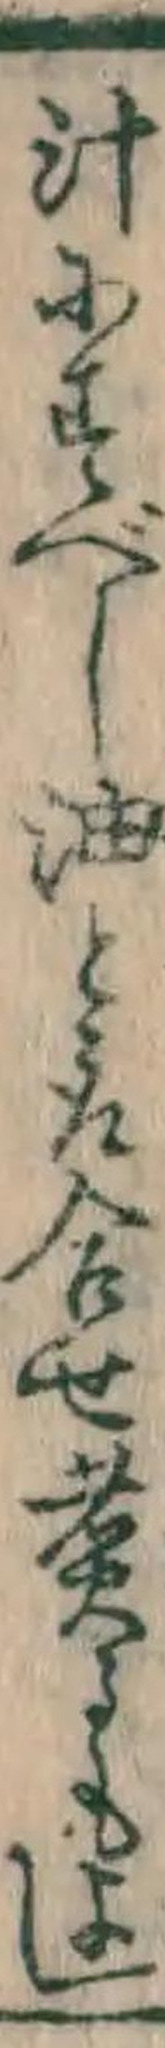汁にすべし油と取合せ煮るもよし
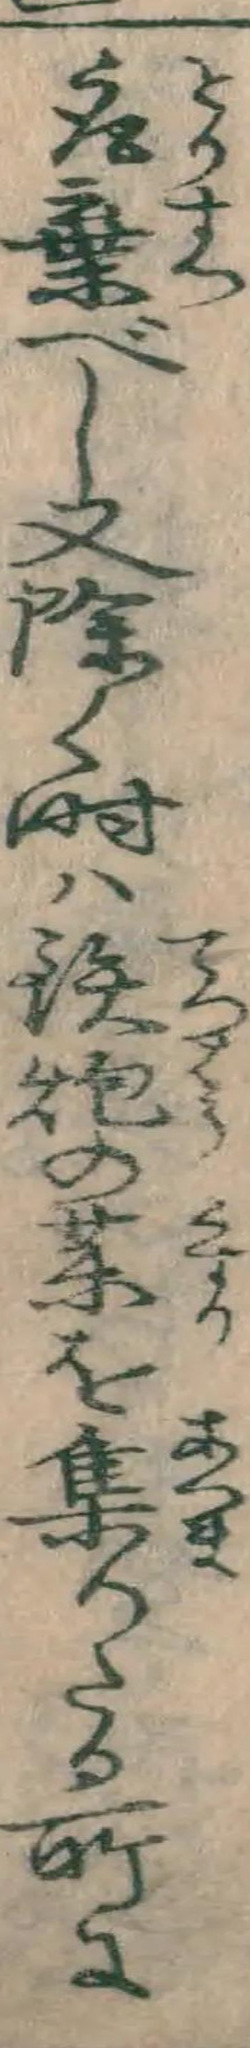取棄べし又除く時は鉄炮の薬を集りたる所に

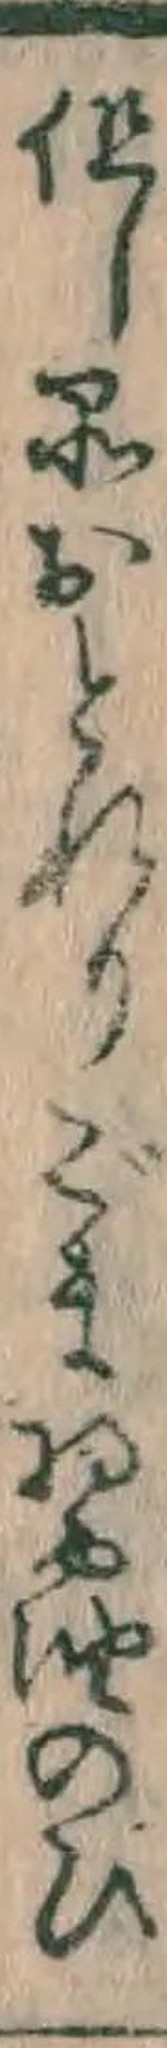但し品おとれりごま醬油のひ
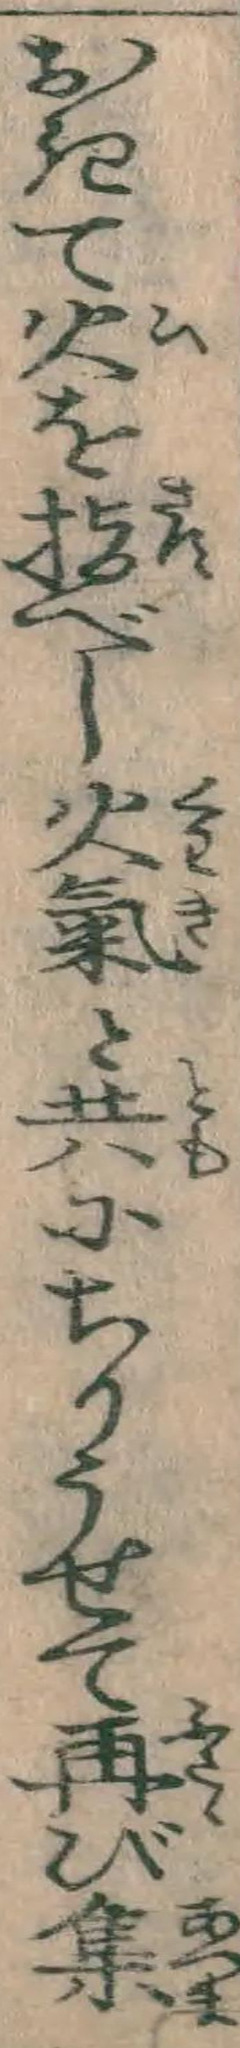おきて火を指べし火気と共にちりうせて再び集
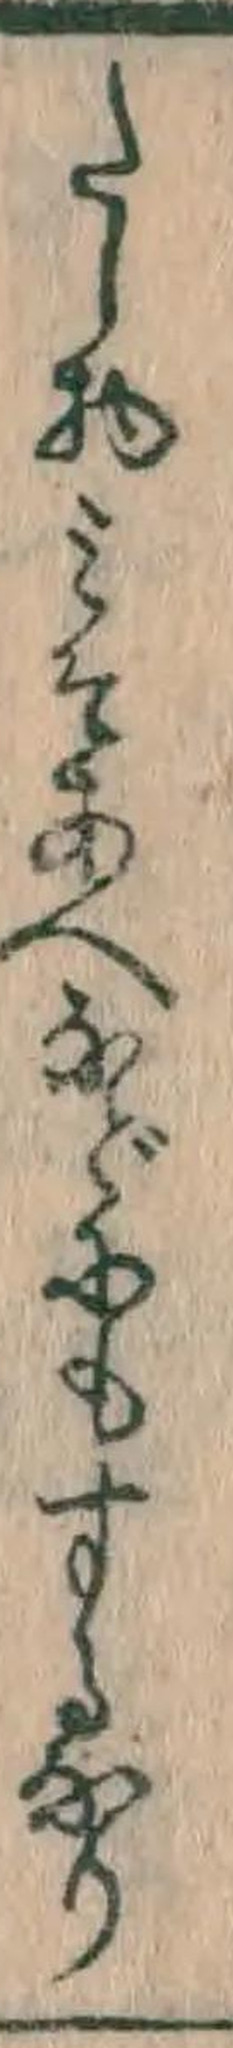たし物みそあへなどにもするなり
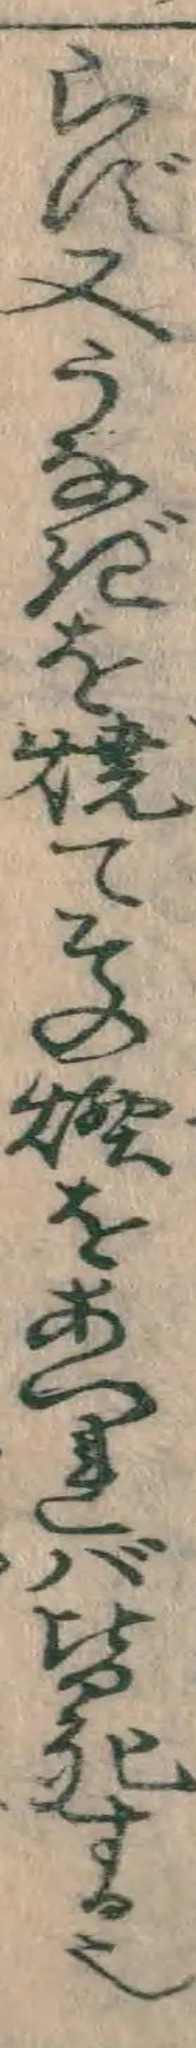らず又うなぎを焼てその煙をあつれば皆死する也
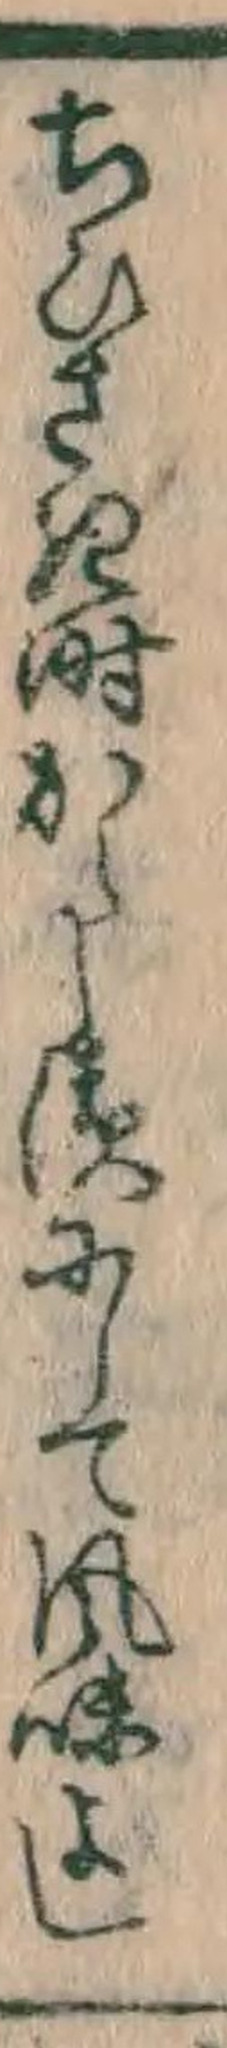ちひさき時からし漬にして風味よし
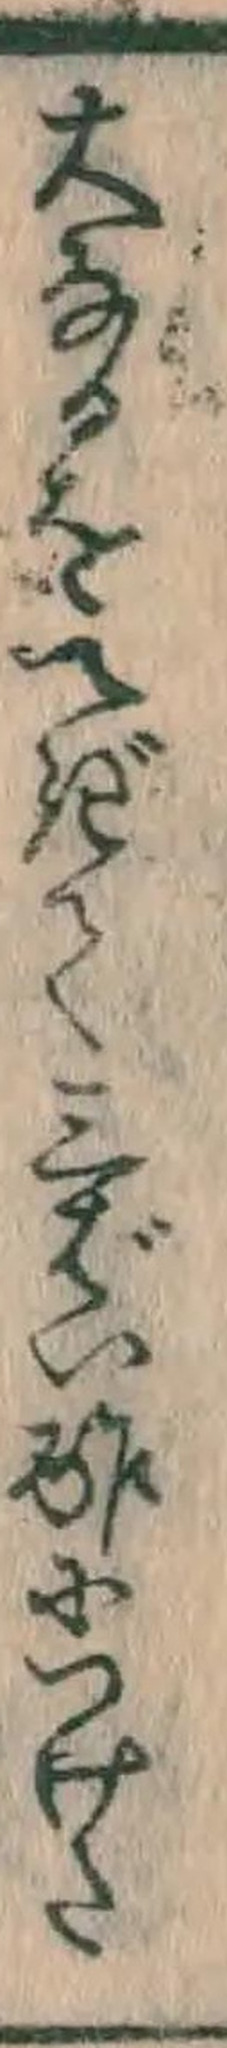大なるをへぎて三ばい酢につけた
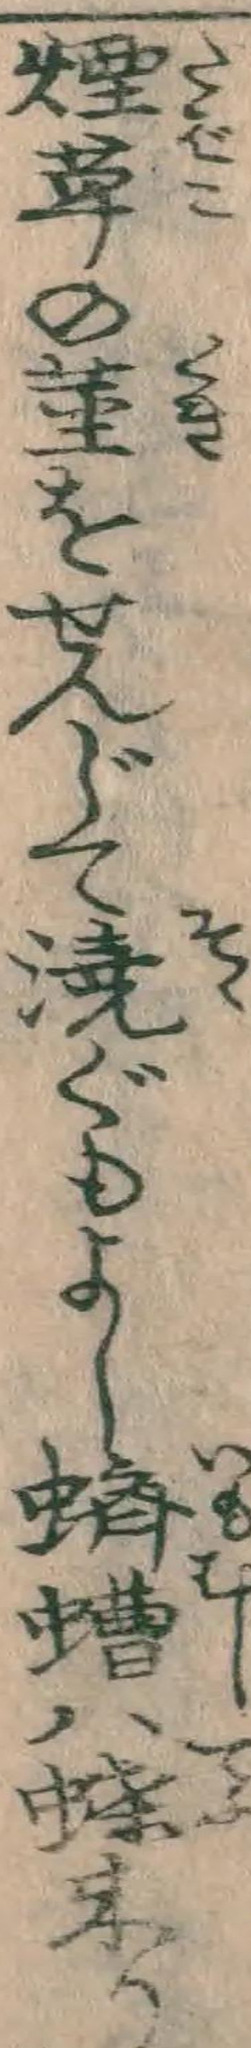煙草の茎をせんじて澆ぐもよし蠐螬は蝶来り
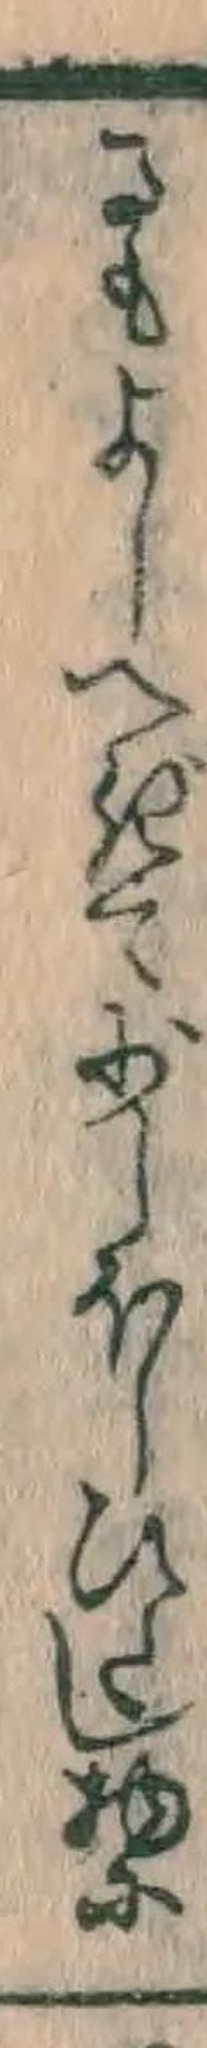るもよしへぎて少しほしひたし物に
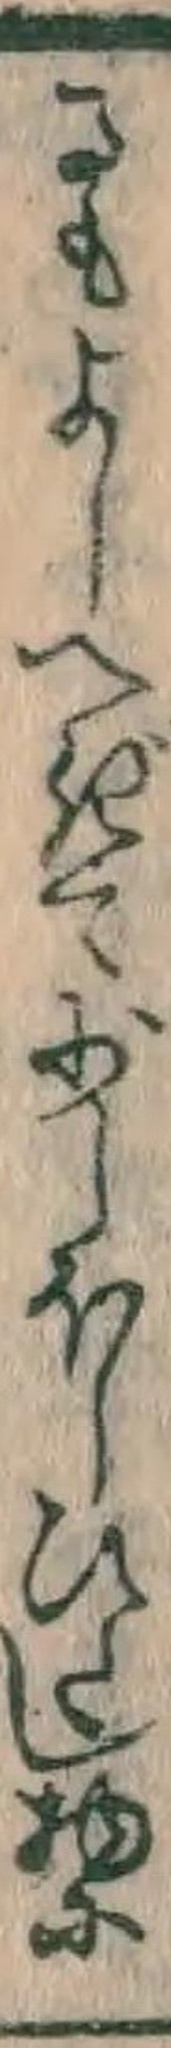るもよしへぎて少しほしひたし物に
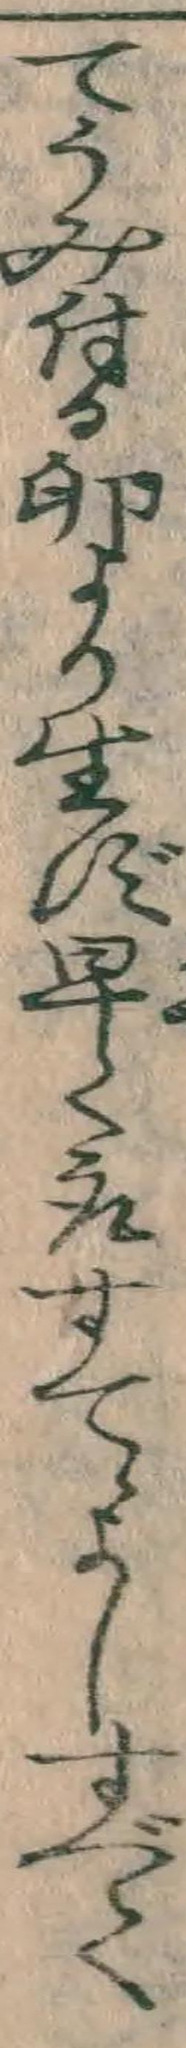てうみ付る卵より生ず早く取すてゝよしすべて
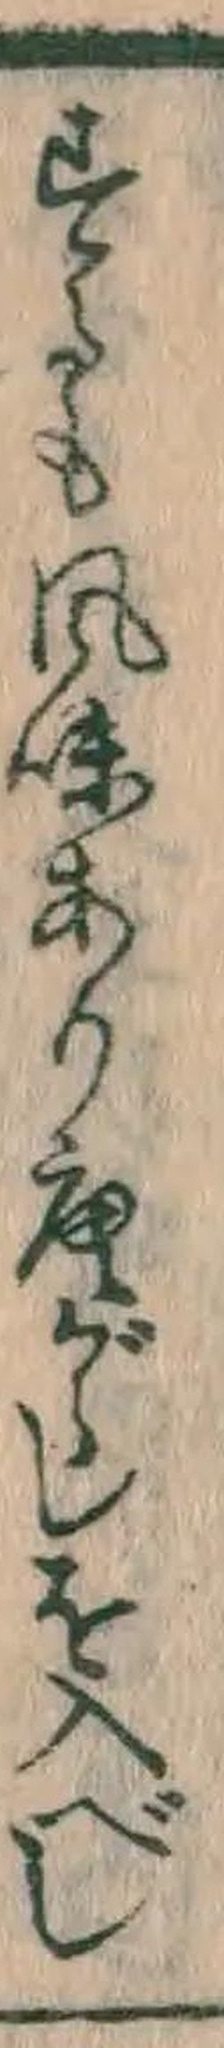するも風味あり唐がらしを入べし
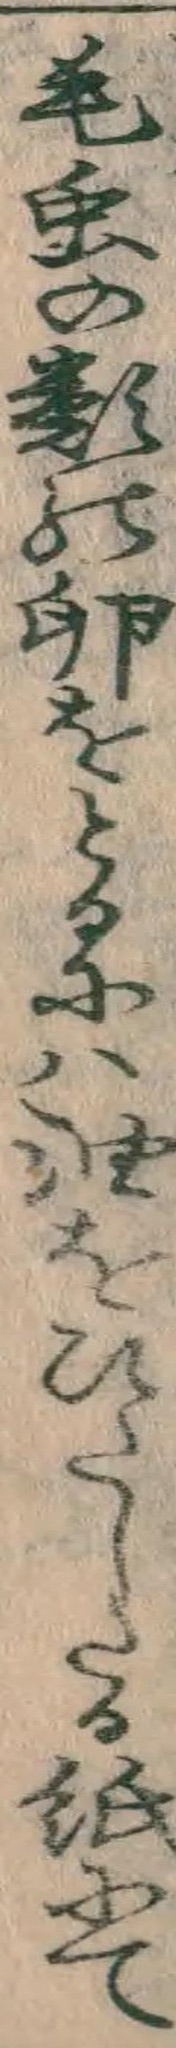毛虫の類の卵をとるには油をひたしたる紙にて
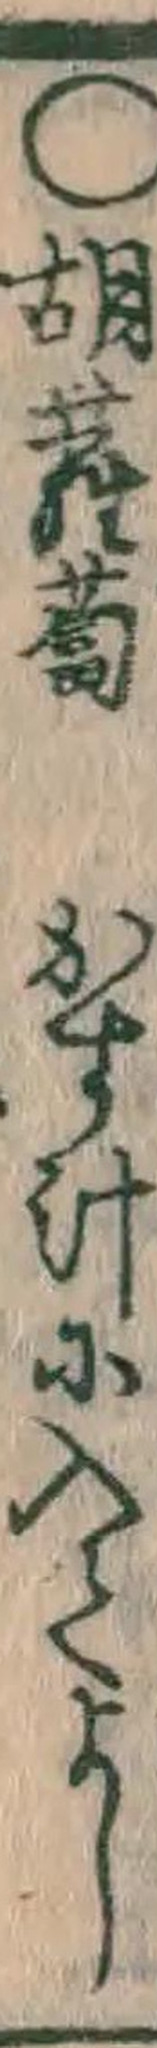○胡蘿蔔かす汁に入てよし
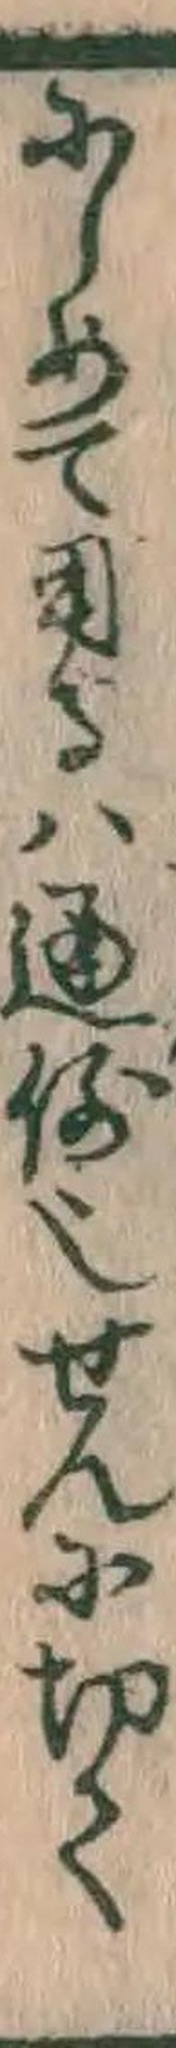にしめて用るは通例也せんに切て
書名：広益秘事大全 3巻. [5]
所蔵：国立国会図書館 National Diet Library, JAPAN
